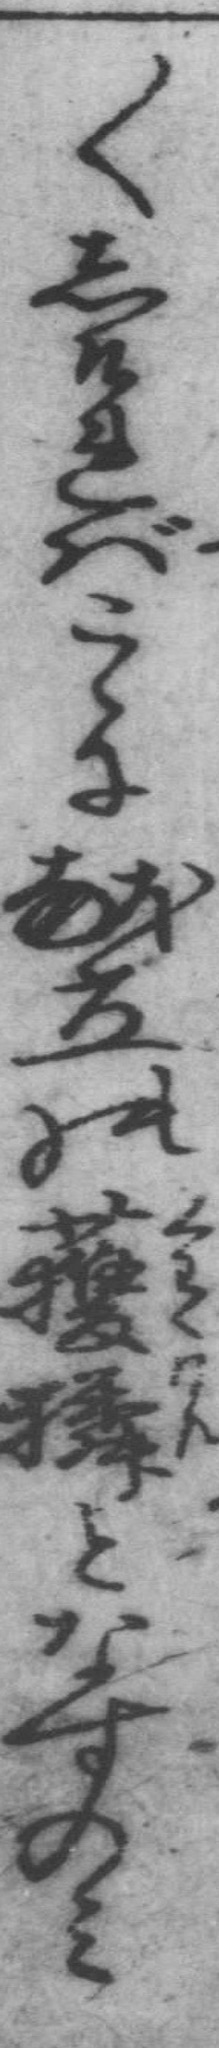〳〵しけれバこに献立のとなすのミ

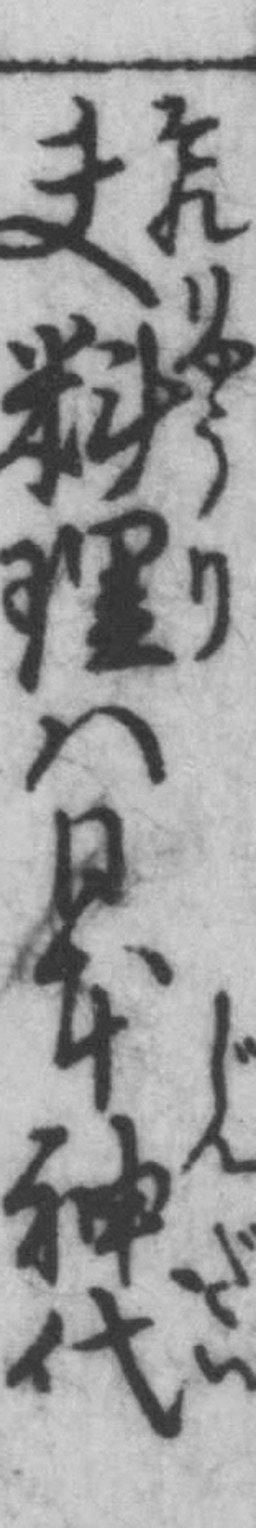夫料理ハ日本神代
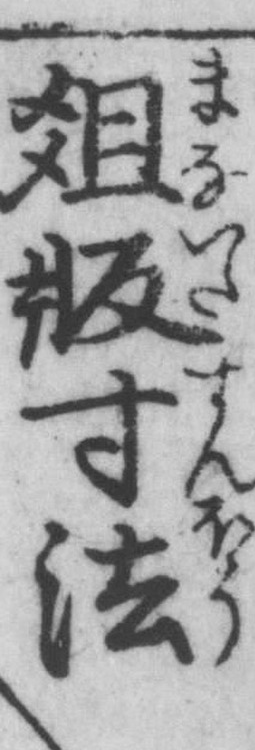俎板寸法
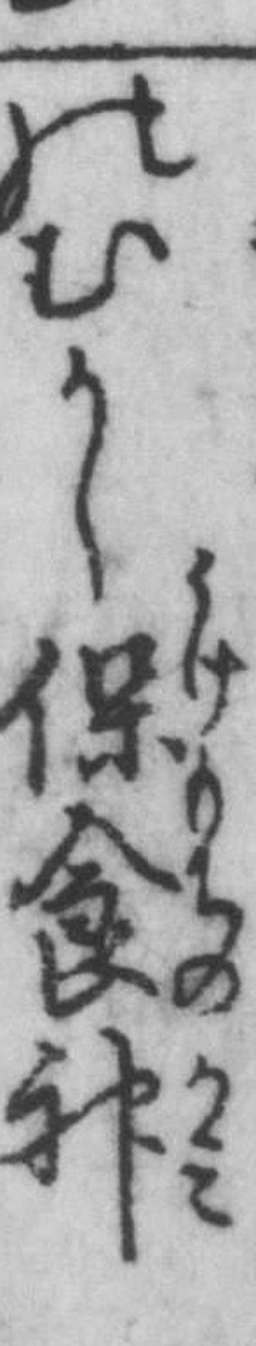のむかし保食神
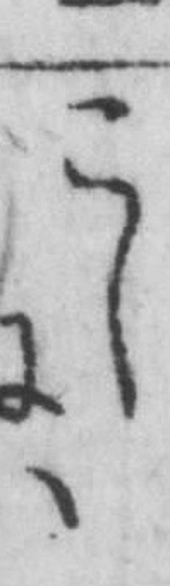こしにハ
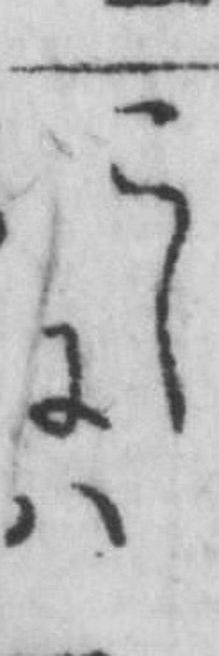こしにハ
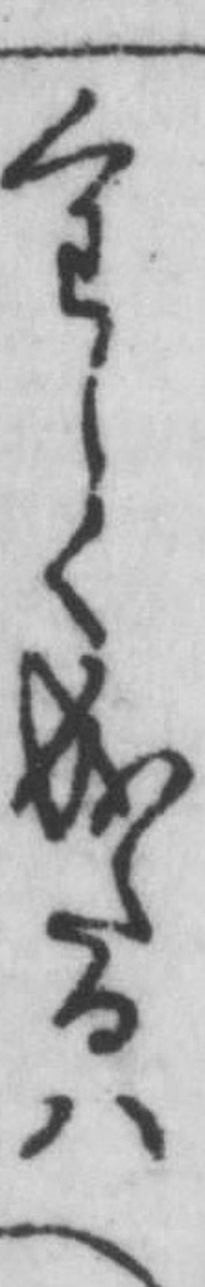くわしく成たるハ
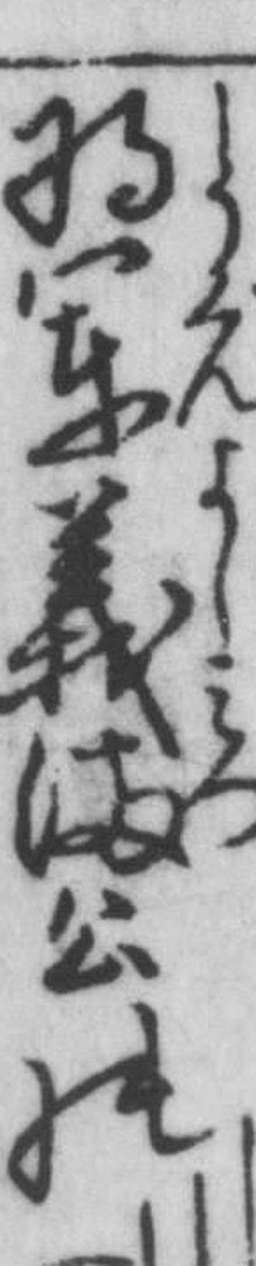将軍義満公の
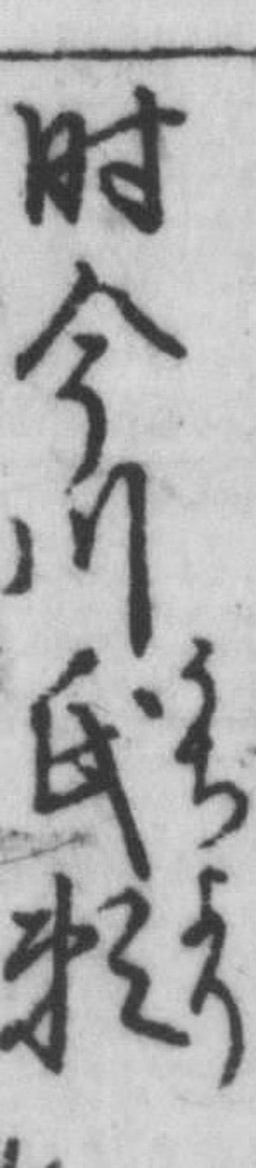時今川氏頼
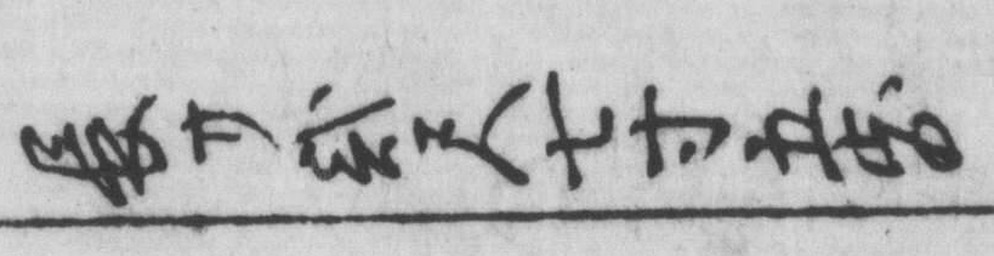長サ弐尺七寸五分
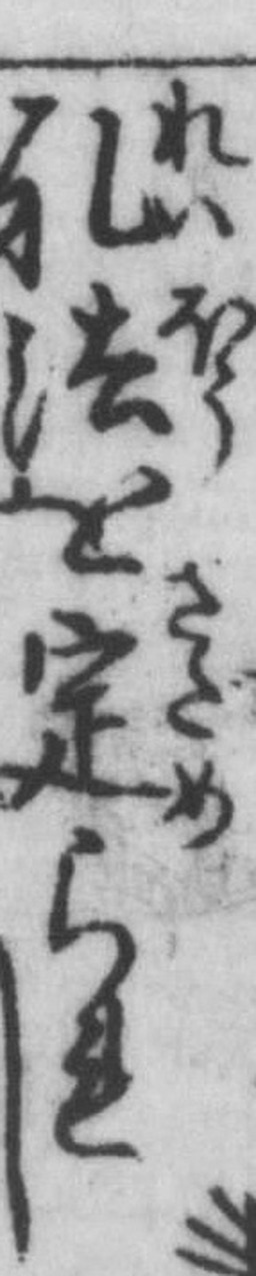礼法を定られし
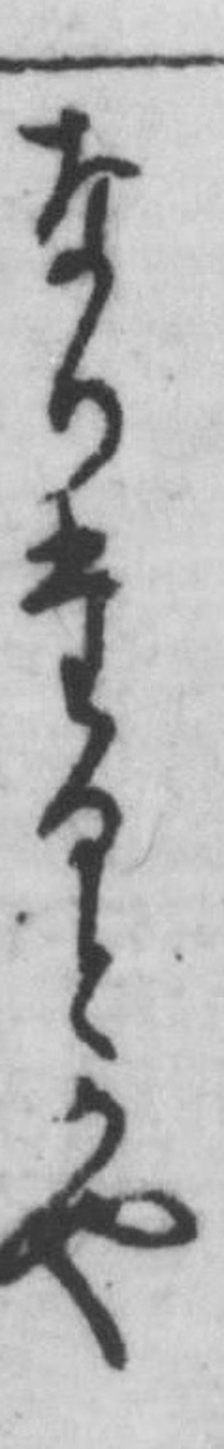なりるとかや
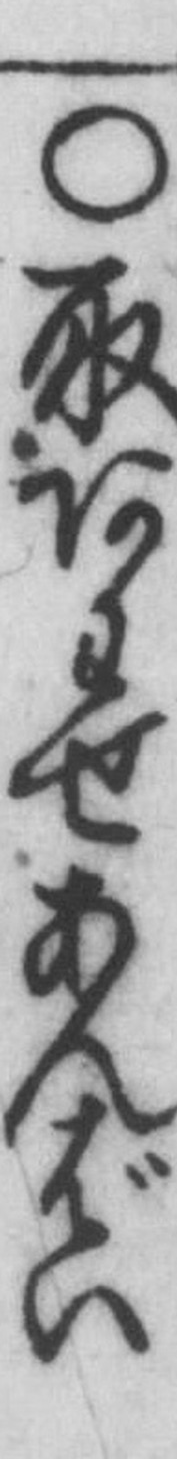〇取あわせあんばい
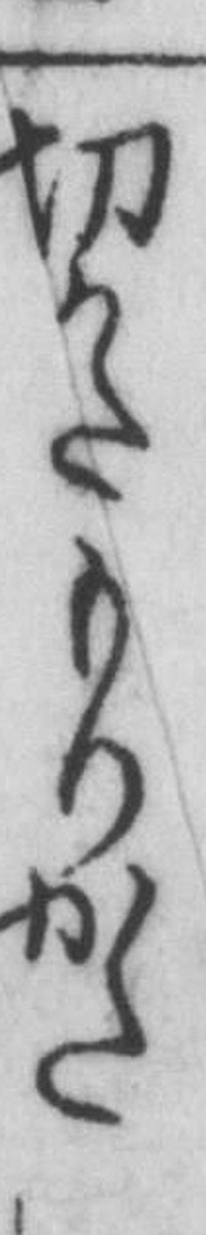切かたもりかた
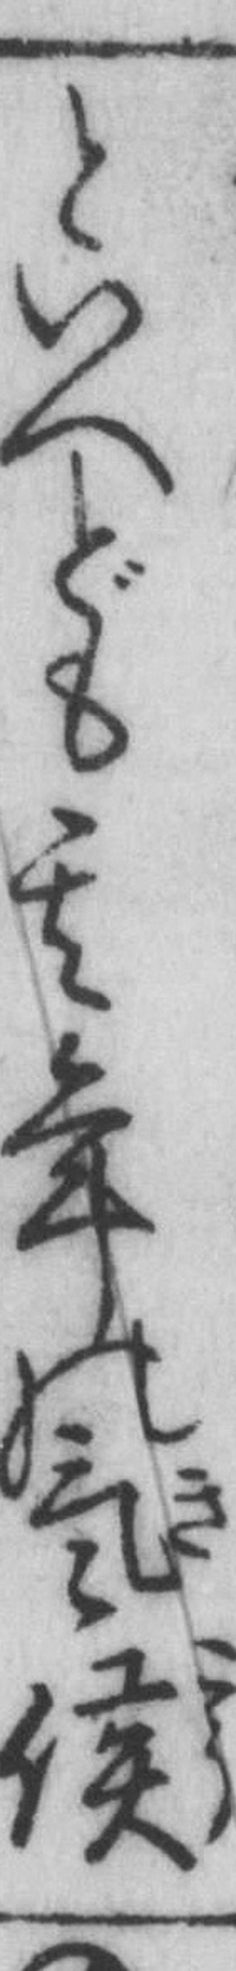といへども年の気候
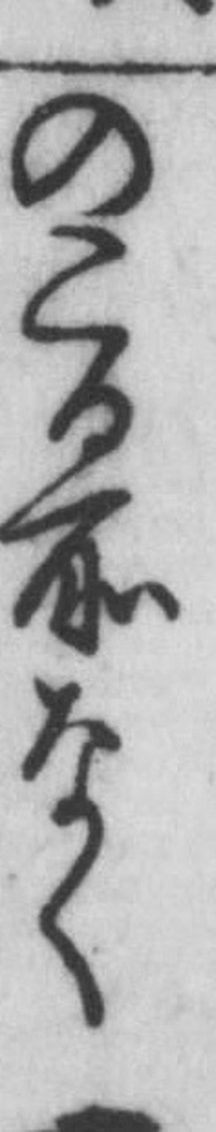のこる所なく
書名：料理献立抄
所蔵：大阪府立大学学術情報センター 国文学研究資料館
